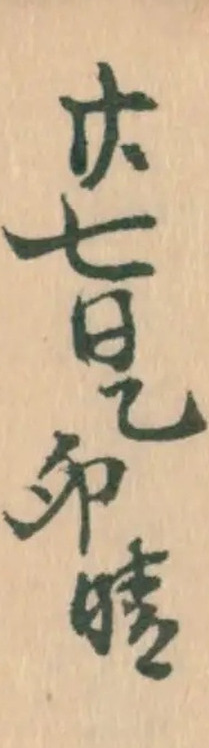廿七日乙卯晴
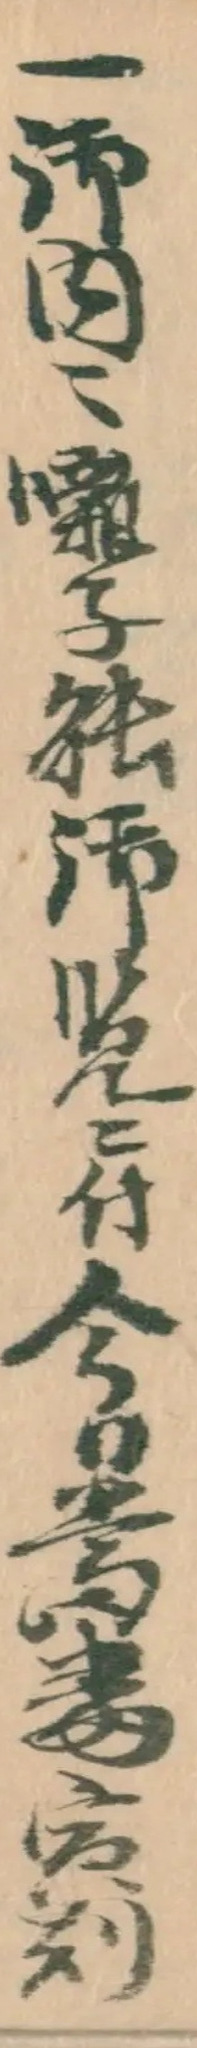一御内々囃能御覧ニ付今日当番寅刻
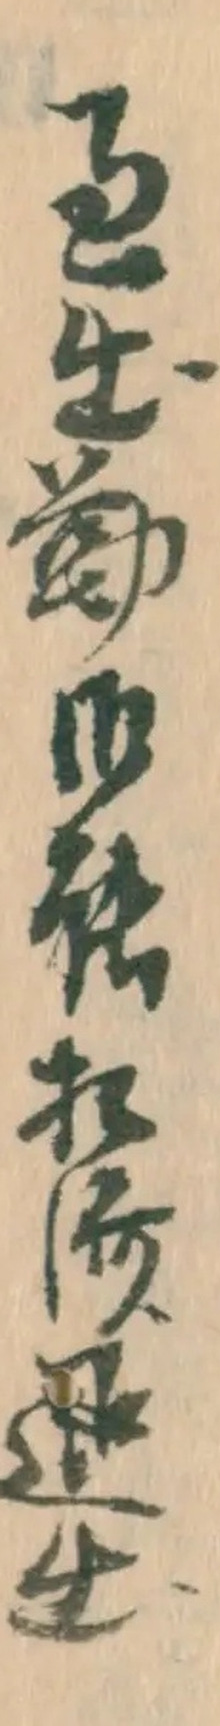過出勤御能相済退出
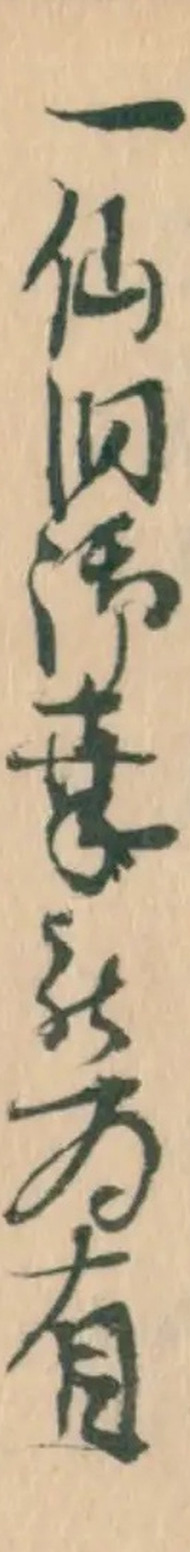一仙洞御幸被為有
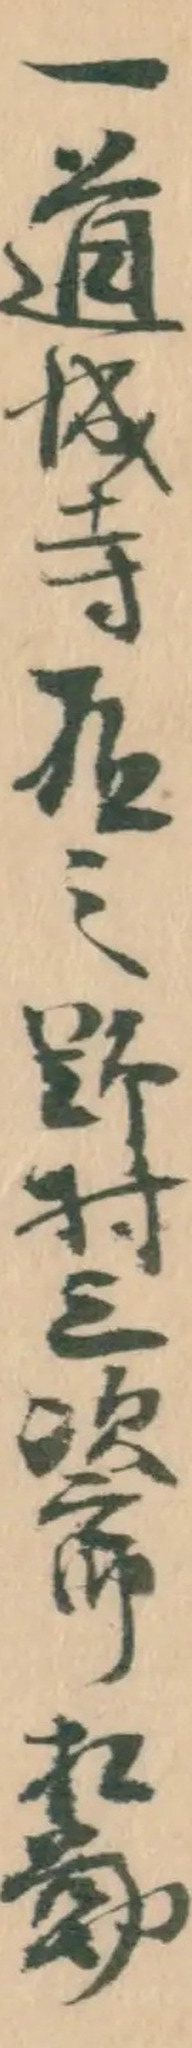一道成寺有之野村三次郎相勤

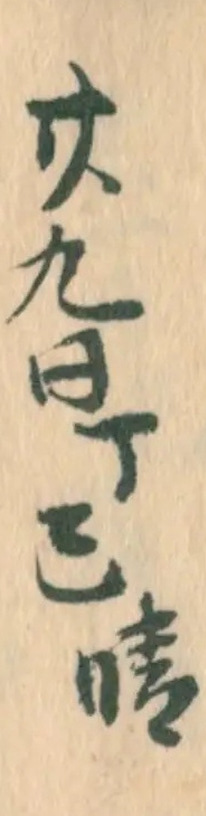廿九日丁巳晴
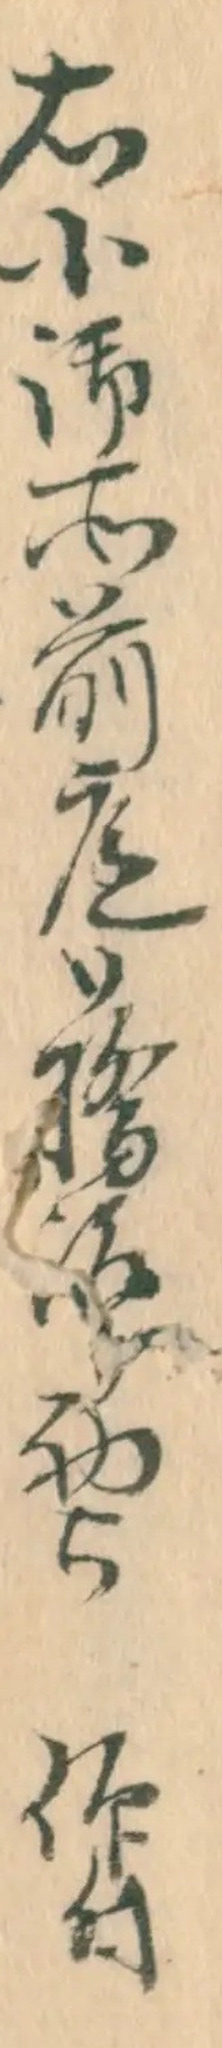右小御所前庭御橋渡り初被仰付
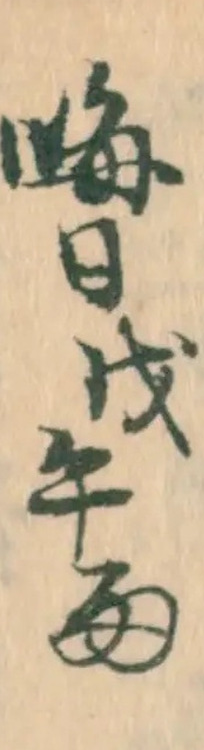晦日戊午雨
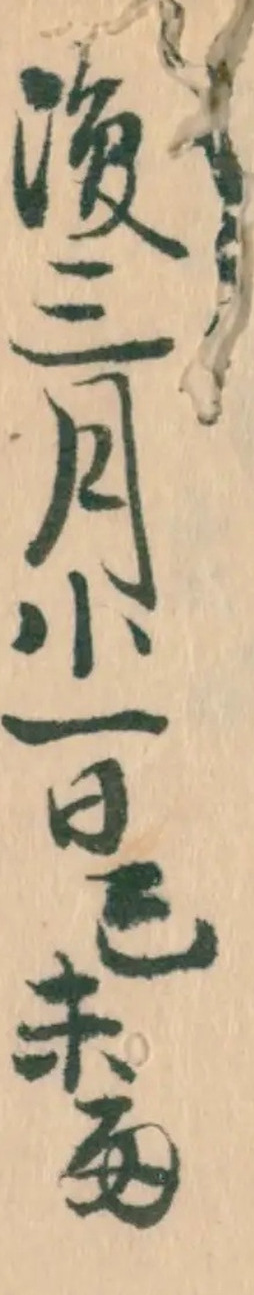復三月小一日己未雨
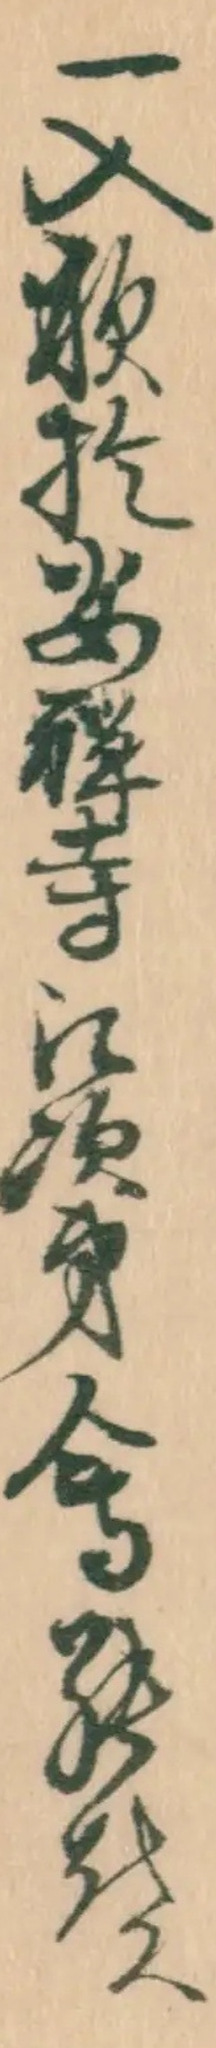一入夜於安禅寺江次第会罷越ス
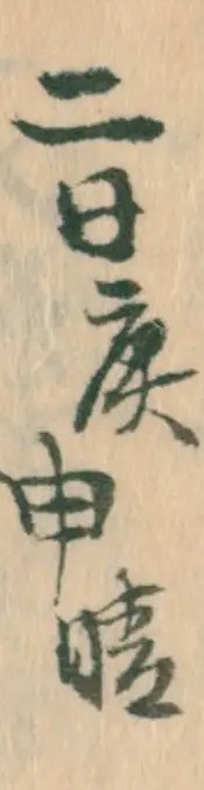二日庚申晴
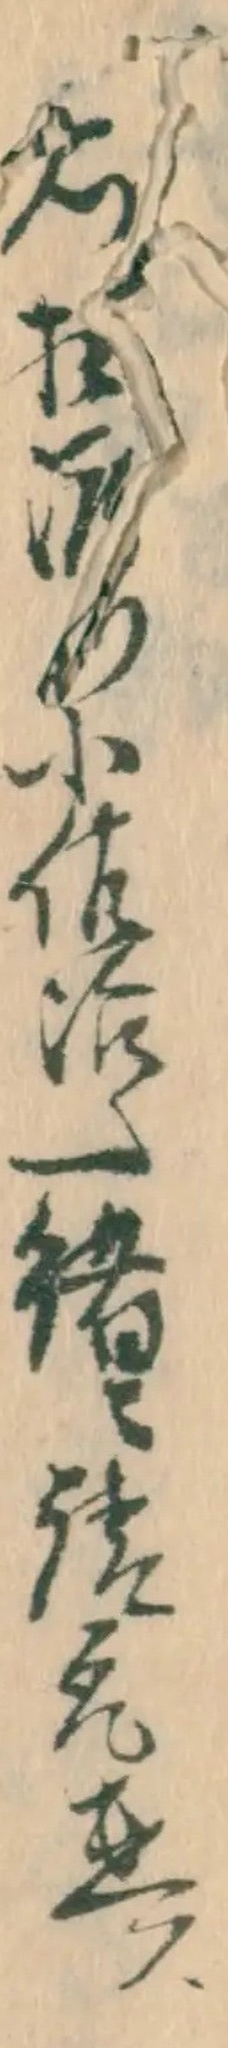右相渡り小佐治へ一緒ニ請取遣ス
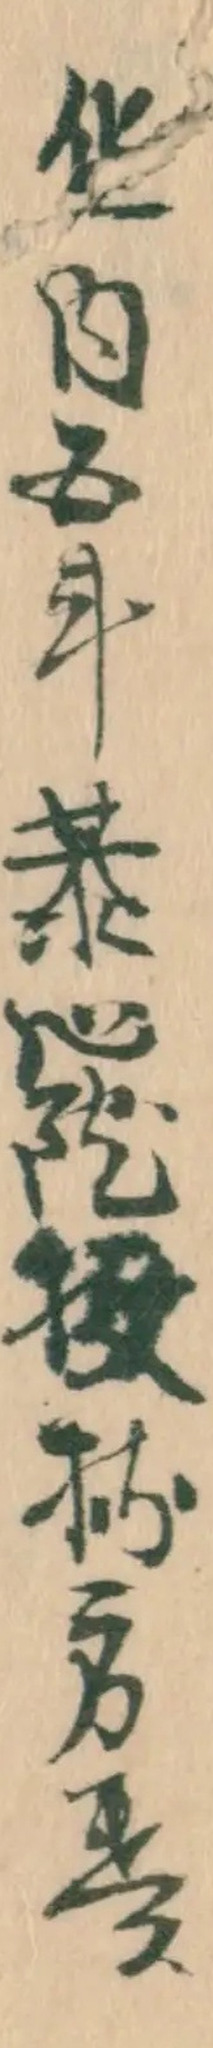但内五斗恭心院扶持方遣ス
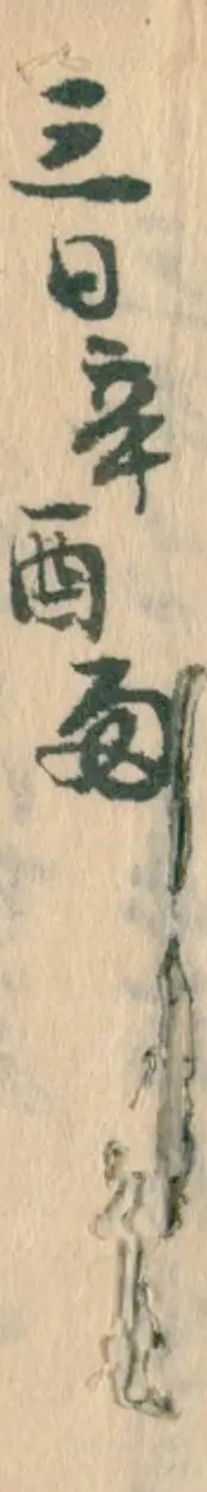三日辛酉雨
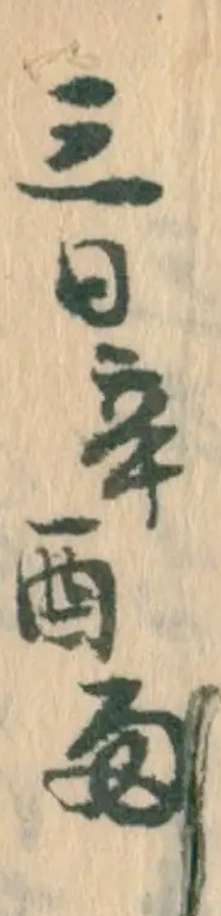三日辛酉雨
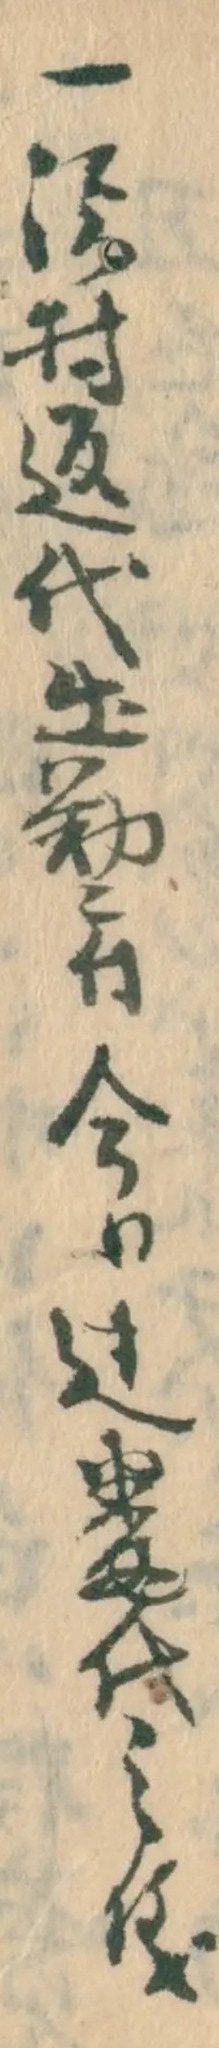一沢村返代出勤ニ付今日辻番代之儀
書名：禁裏御所御用日記. [131]
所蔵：国立国会図書館 National Diet Library, JAPAN
